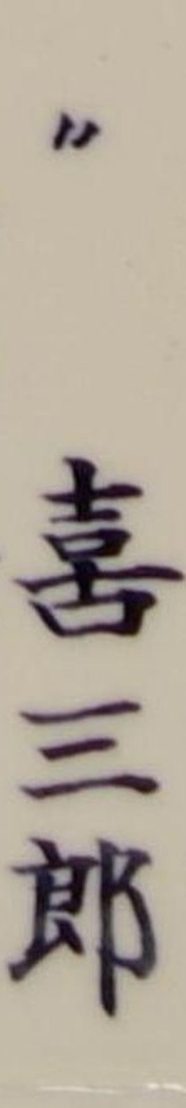喜三郎
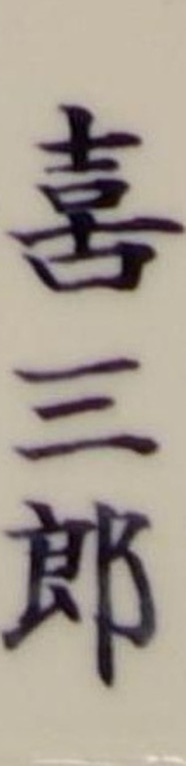喜三郎
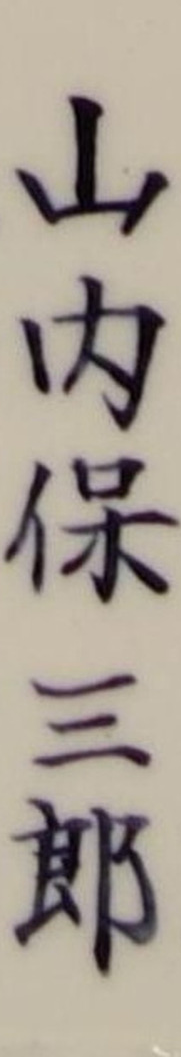山内保三郎
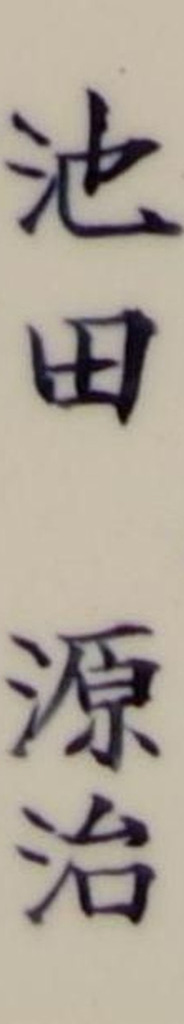池田源治
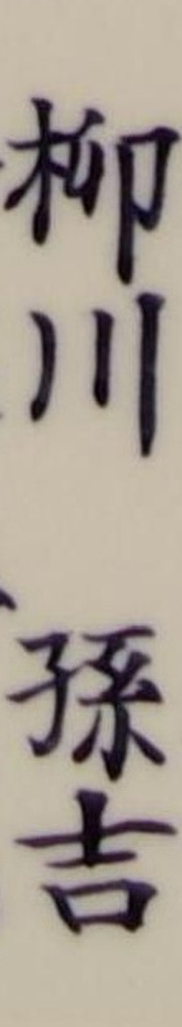柳川孫吉
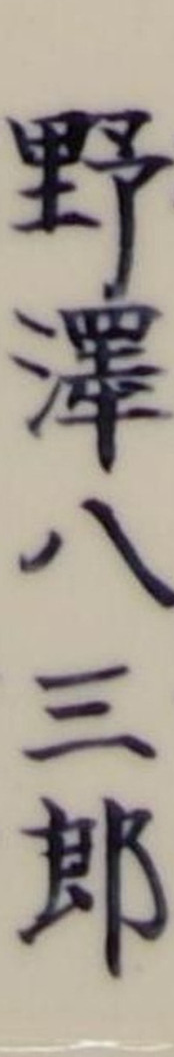野澤八三郎
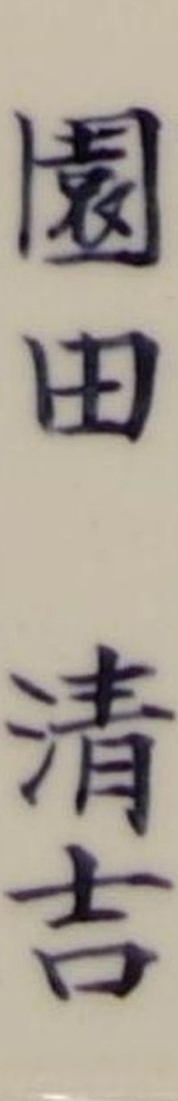園田清吉
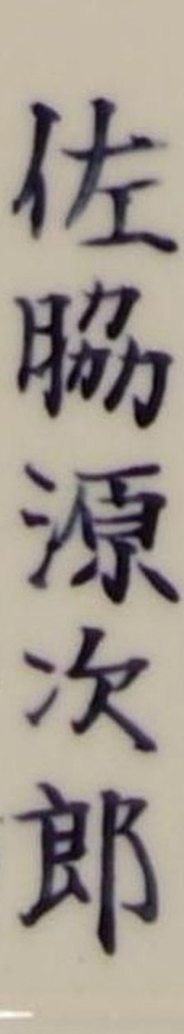佐脇源次郎
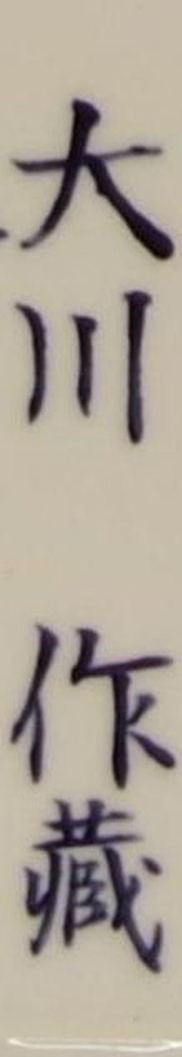大川作蔵
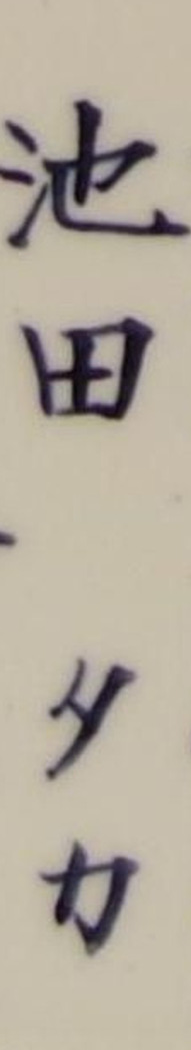池田タカ
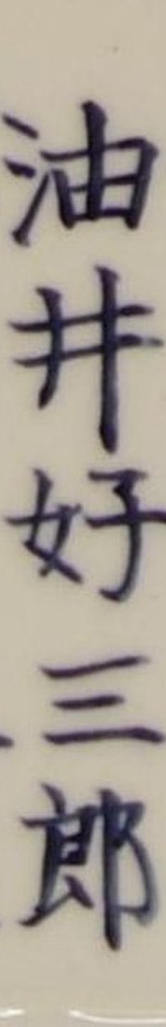油井好三郎
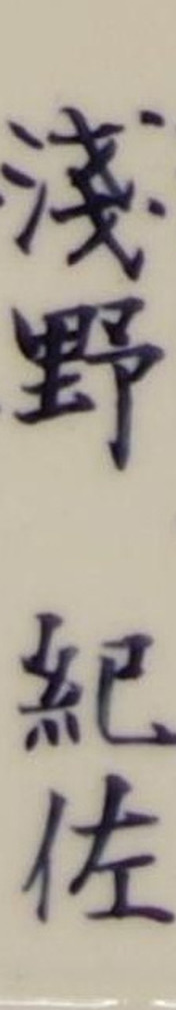浅野紀佐
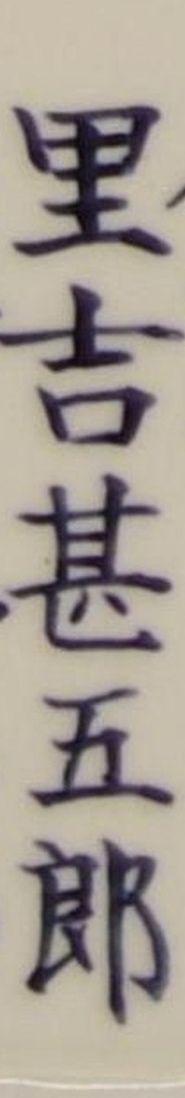里吉甚五郎
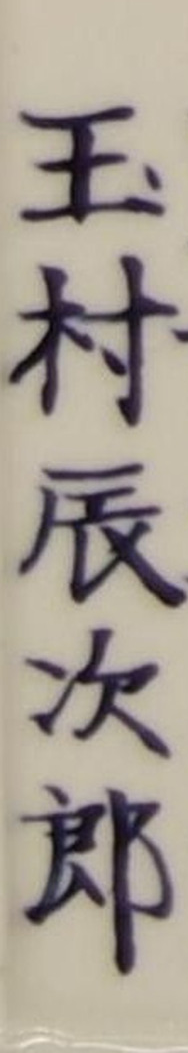玉村辰次郎

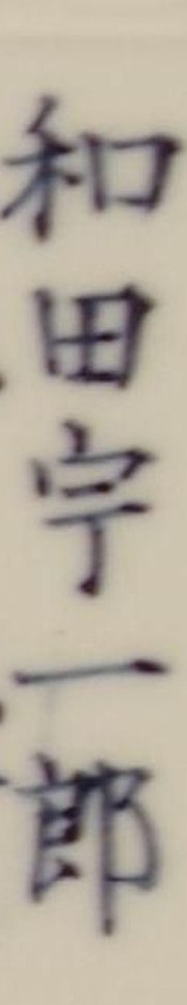和田宇一郎
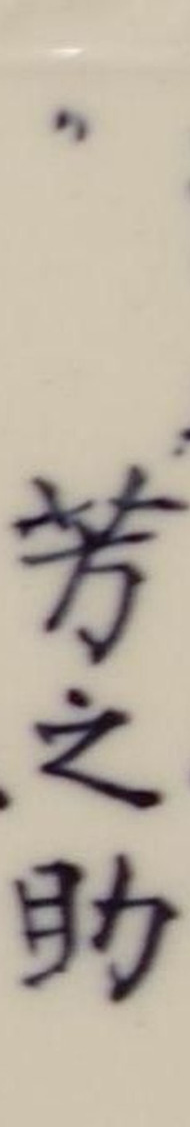芳之助
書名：E~L
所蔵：高野山金剛峯寺
